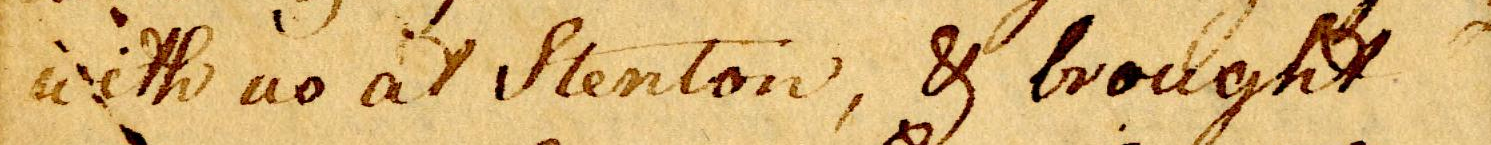with us at Stenton, & brought
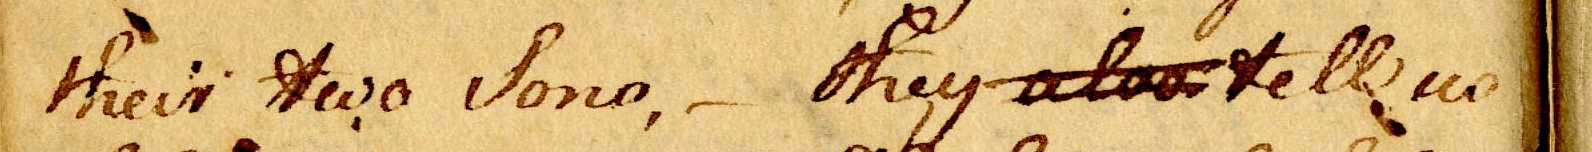their two Sons- they also tell us
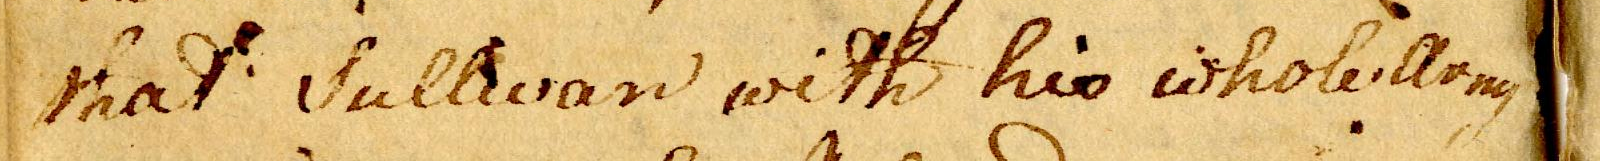that Sullivan with his whole Army
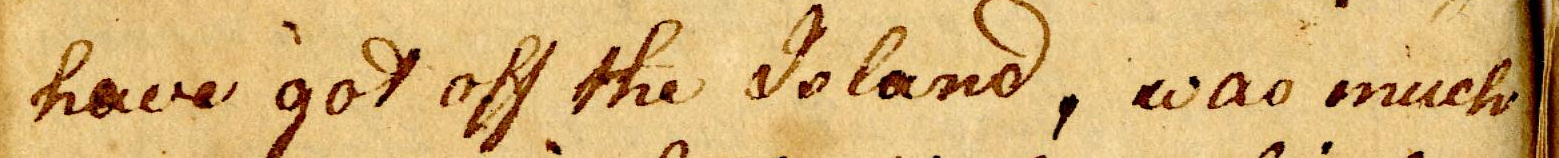have got off the Island, was much
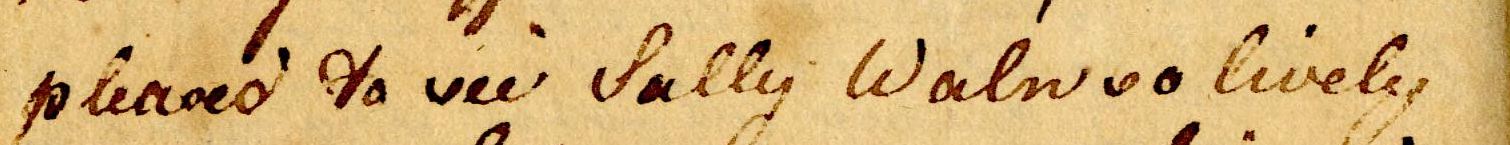pleased to see Sally Waln so lively
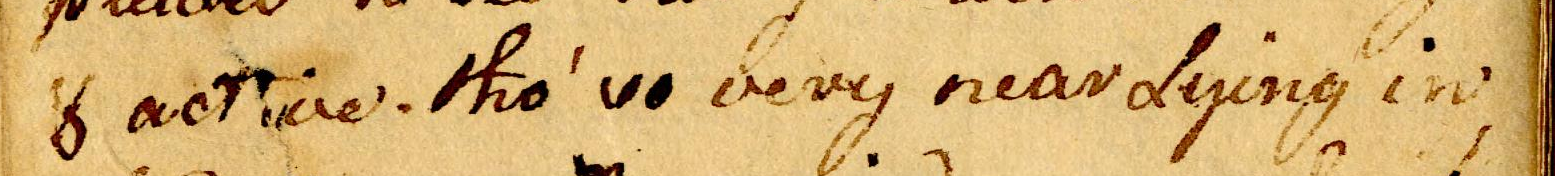& actwe tho' so very near Lying in
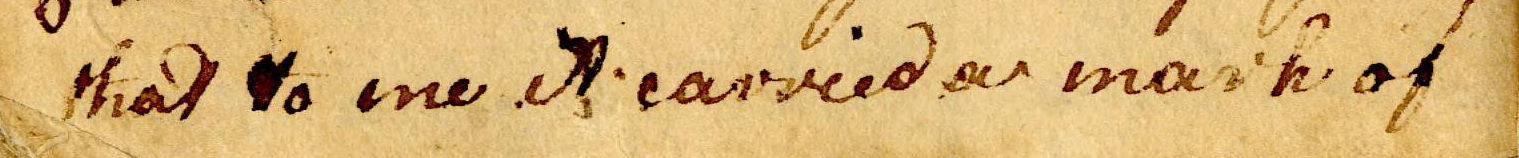that to me it carried a mark of
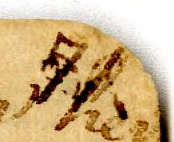71
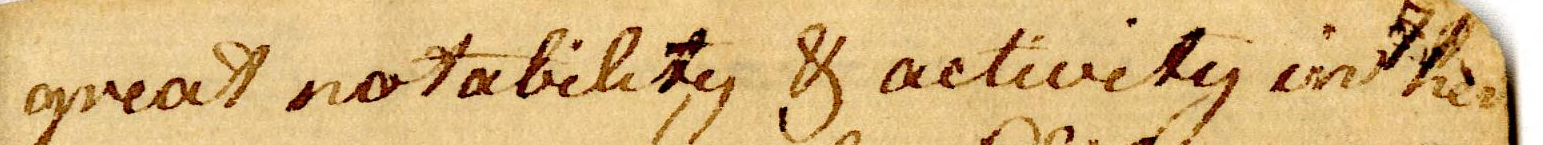great notability & activity int her
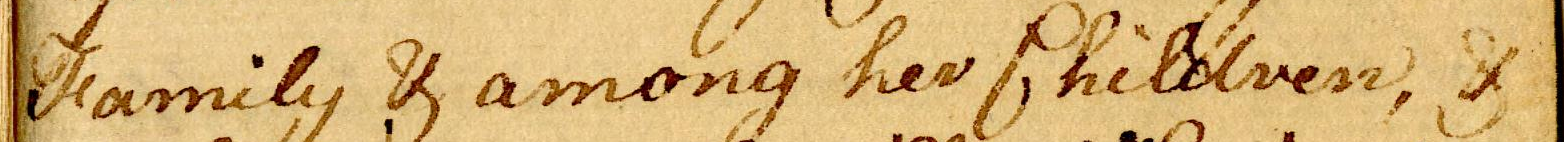Family & among her Children, &
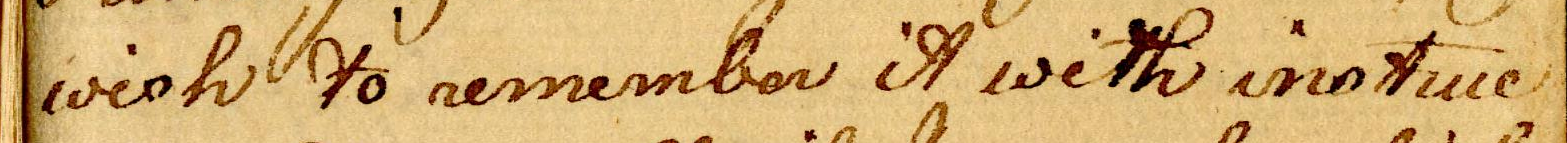wish to remember it with instruc
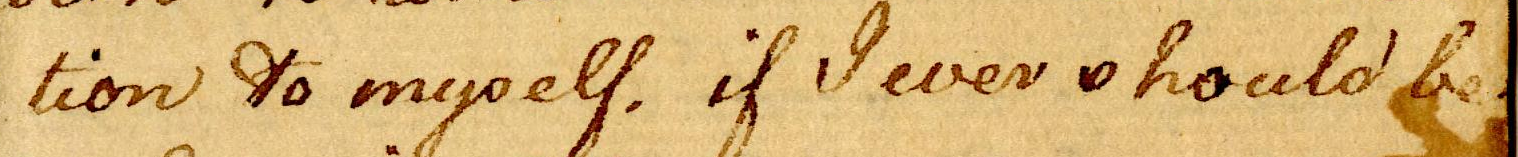tion to myself, if I ever should be
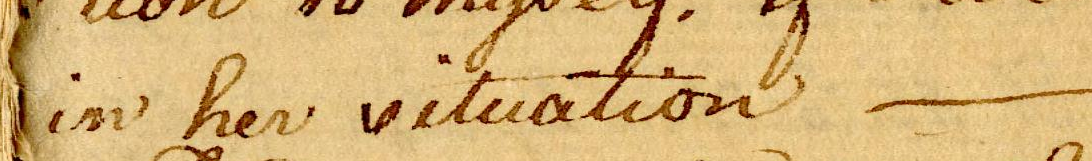in her situation-
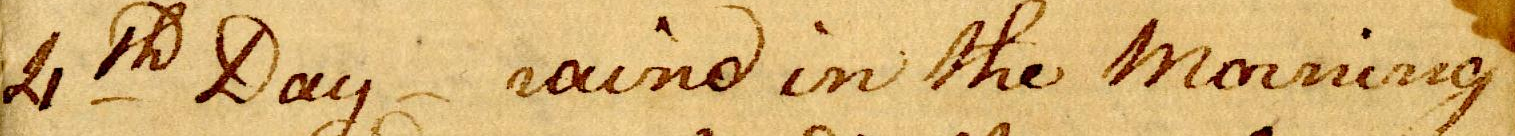4^th Day- raind in the morning
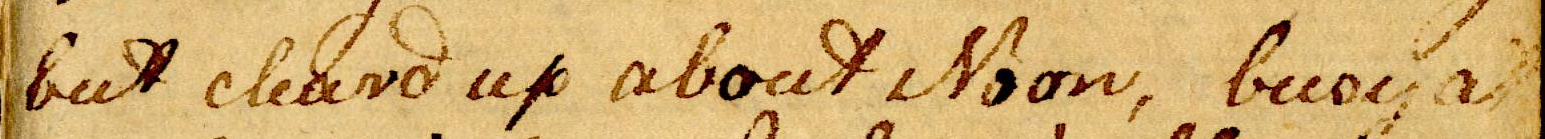but cleard up about Noon, busy a
